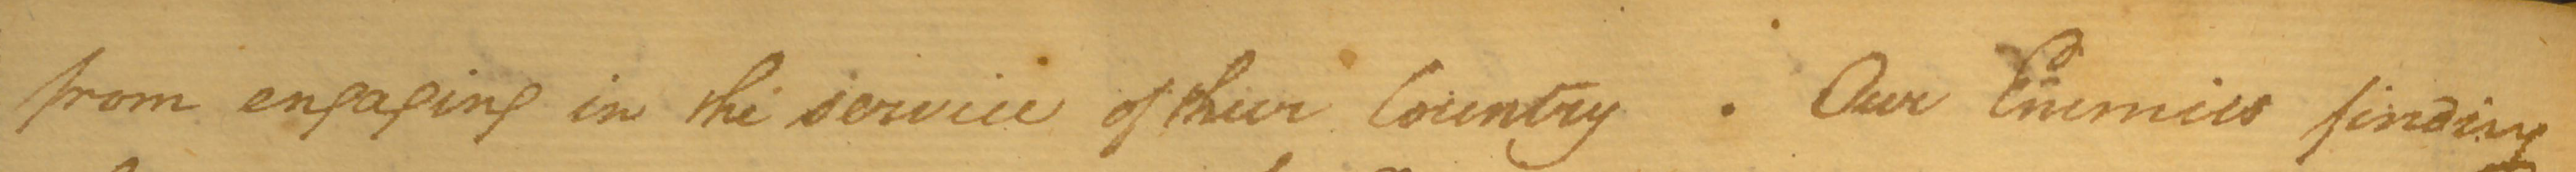from engaging in the service of their Country. Our Enemies finding
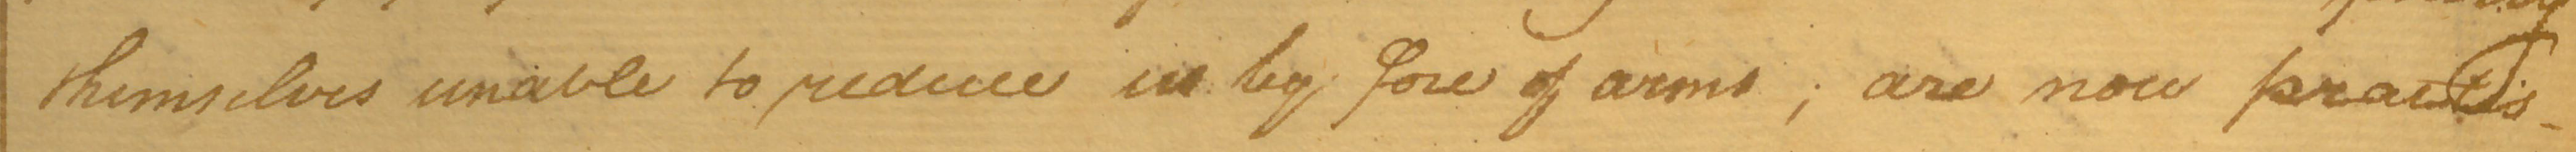themselves unable to reduce us by fore of arms; are now practis-
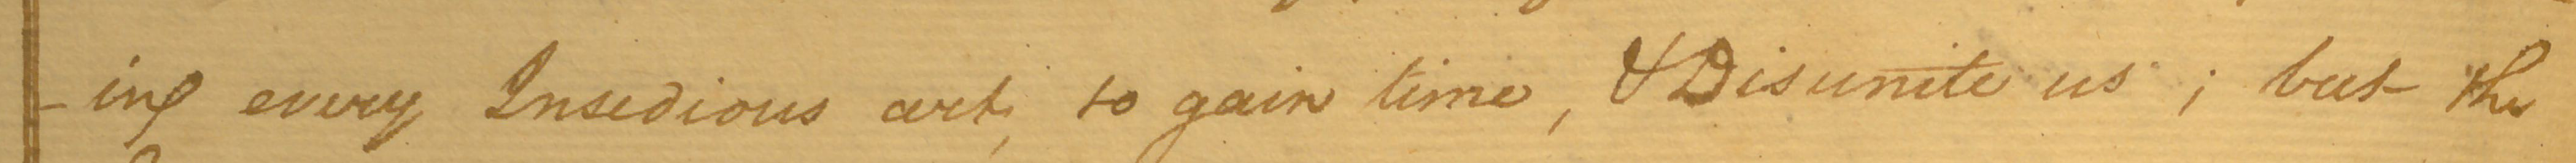-ing every Insidious art, to gain time, & Disunite us; but the
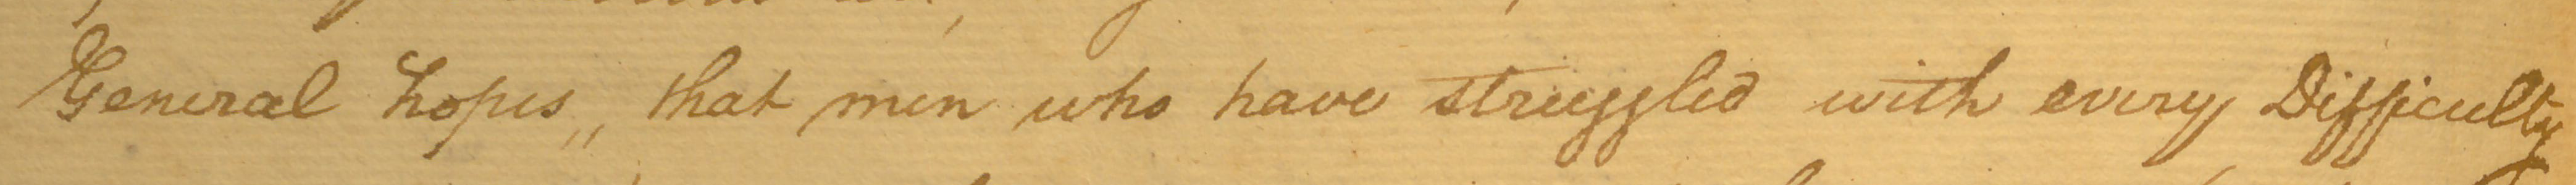General hopes, that men who have struggled with every Difficulty
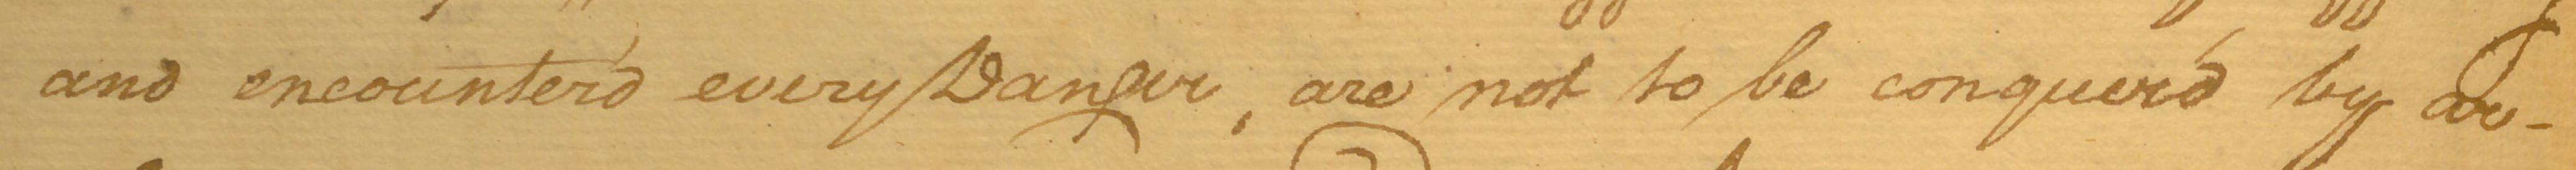and encounter'd every Danger, are not to be conquer'd by ar-
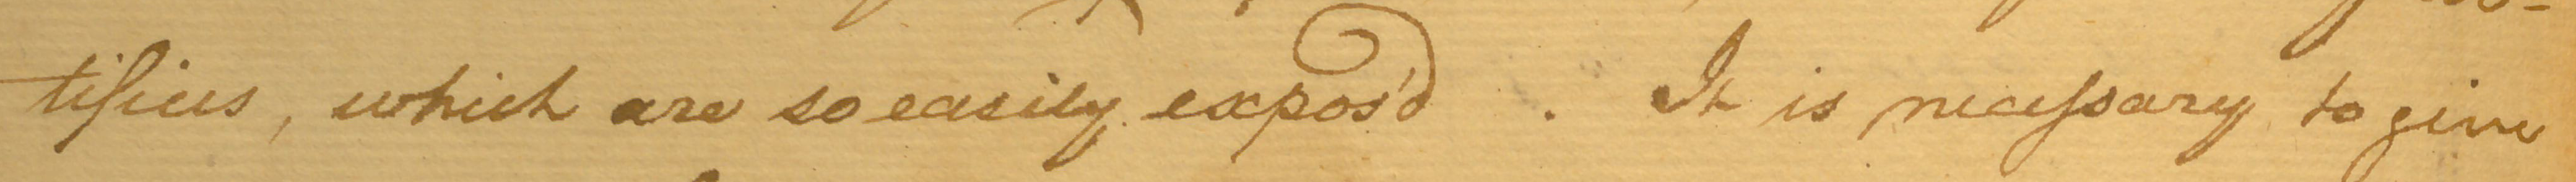tifices, which are so easily expos'd. It is necessary to give
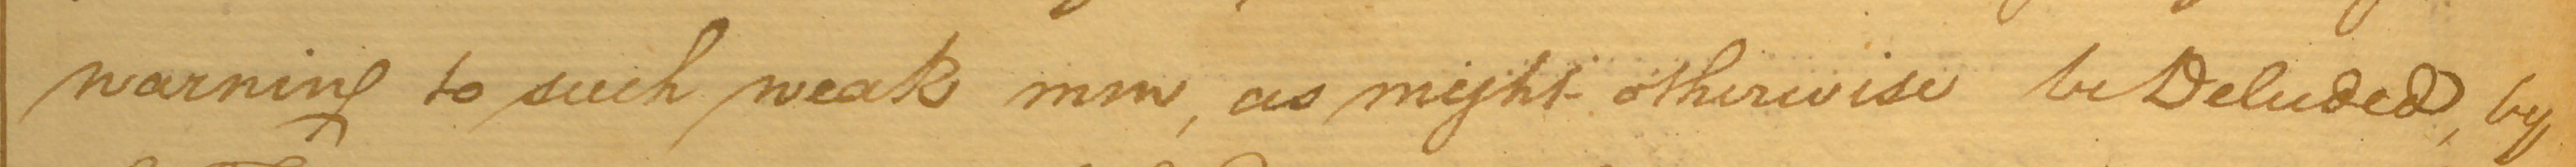warning to such weak men, as might otherwise be Deluded, by
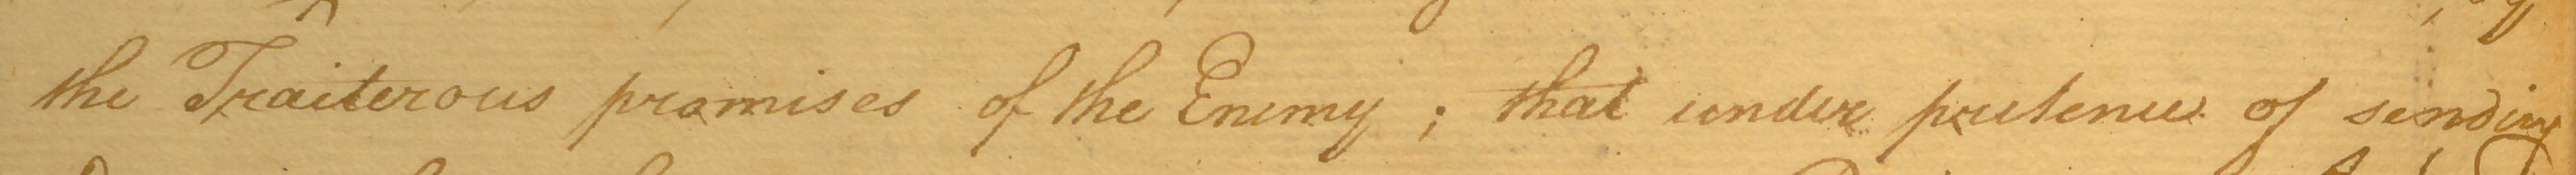the Traiterous promises of the Enemy; that under pretence of sending
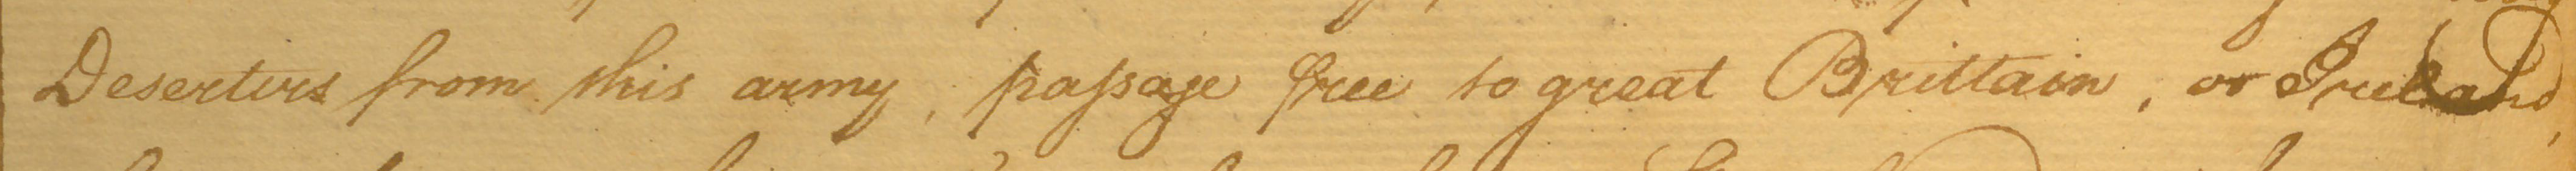Deserters from this army, passage free to great Brittain, or Ireland,
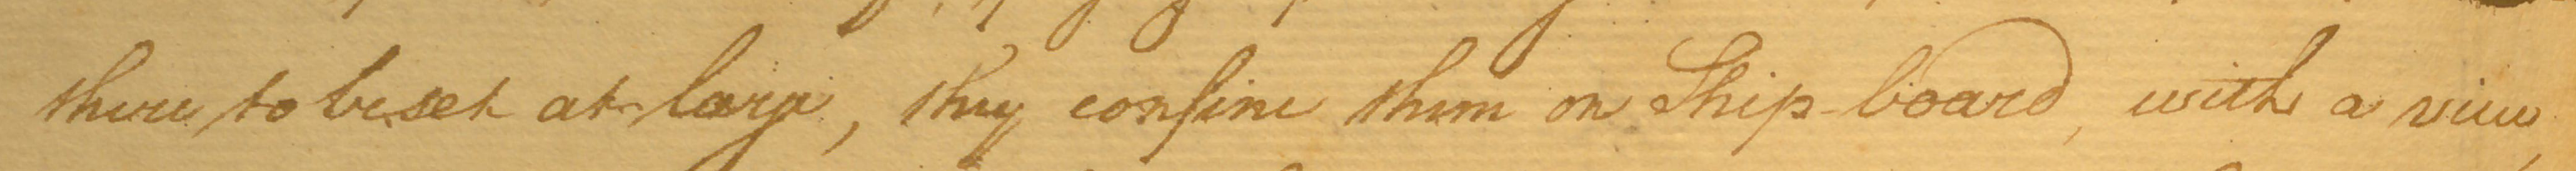there to beset at large, they confine them on Ship board, with a view
